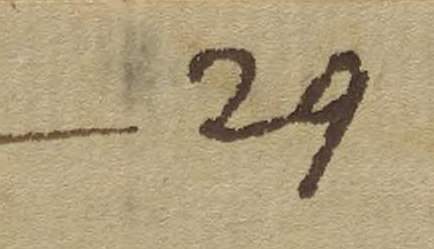29
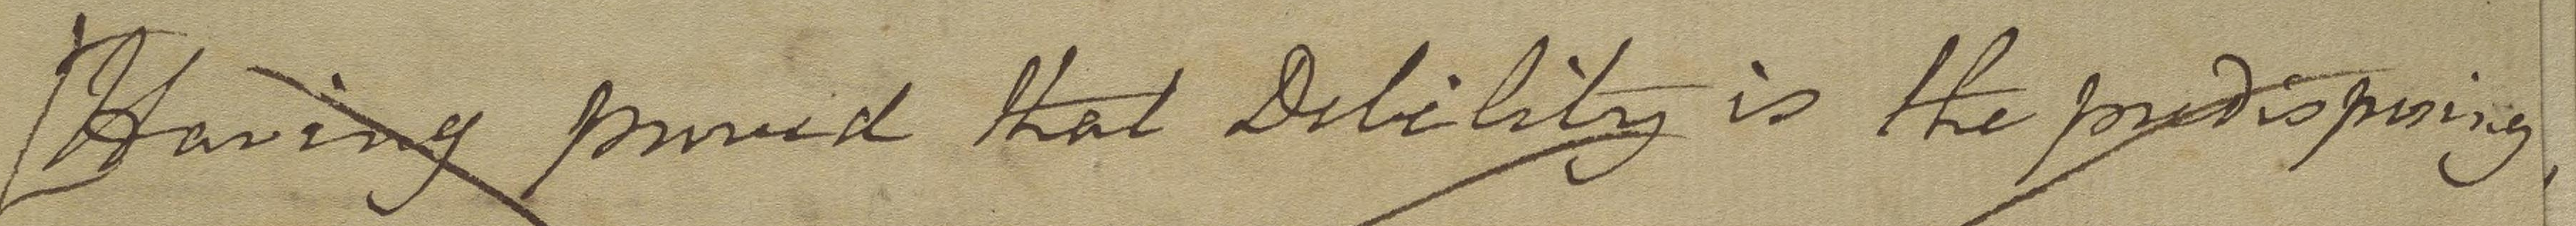Having proved that Debility is the predisposing
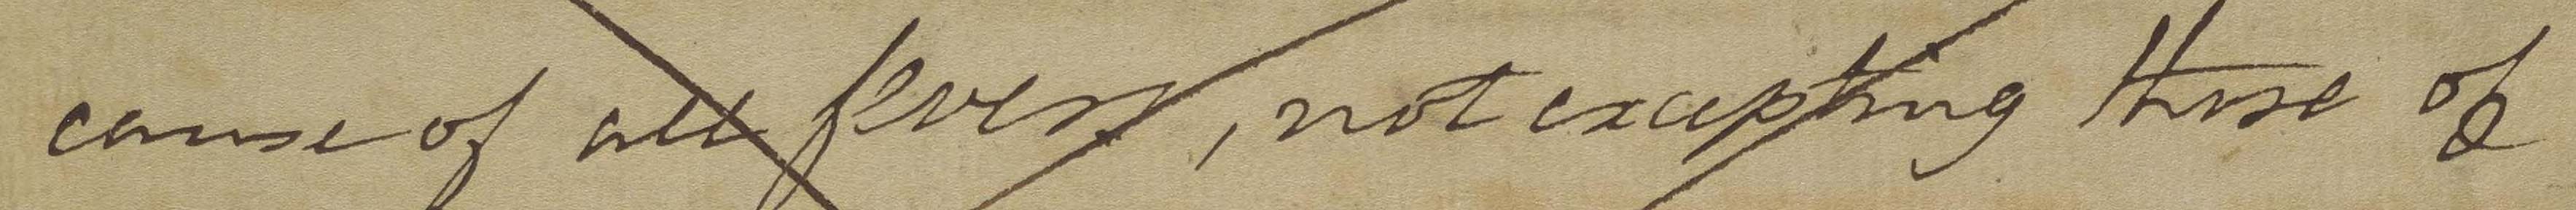cause of all fevers, not excepting those of
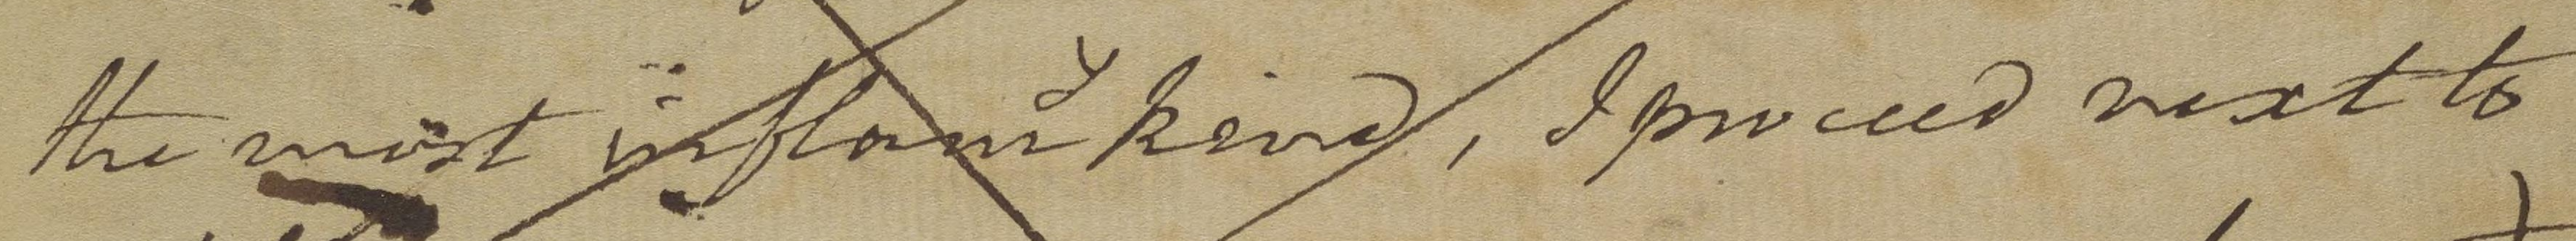the most inflam^y kind, I proceed next to
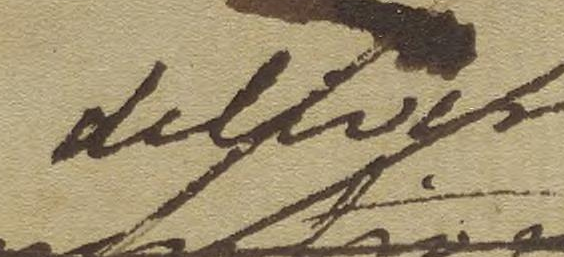deliver
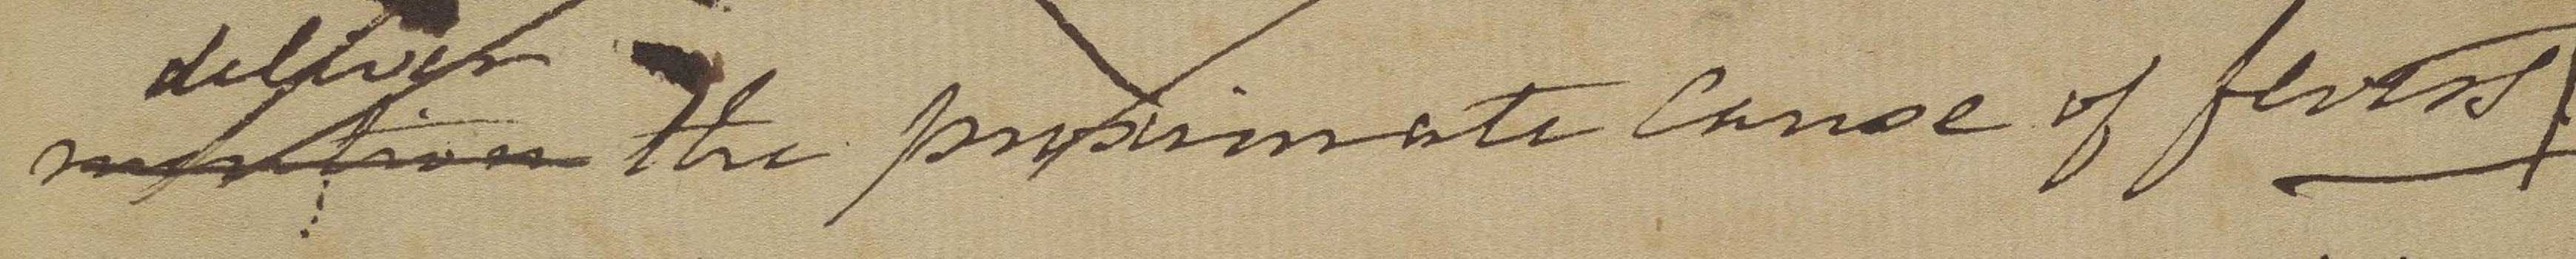[mention] the proximate cause of fevers.)
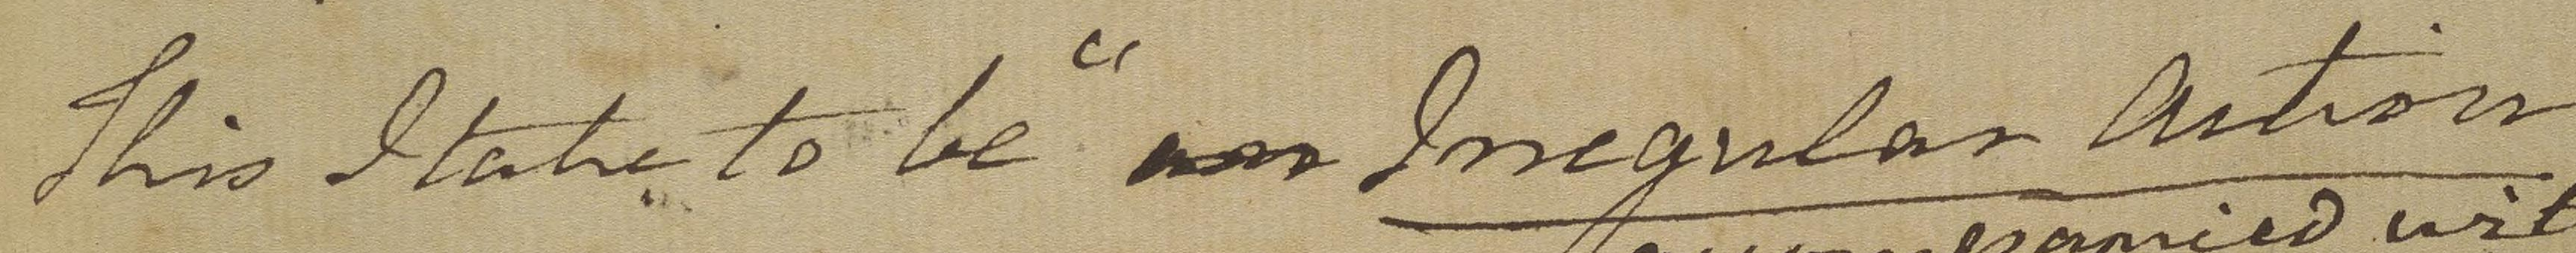This state to be "[__] Irregular Action
